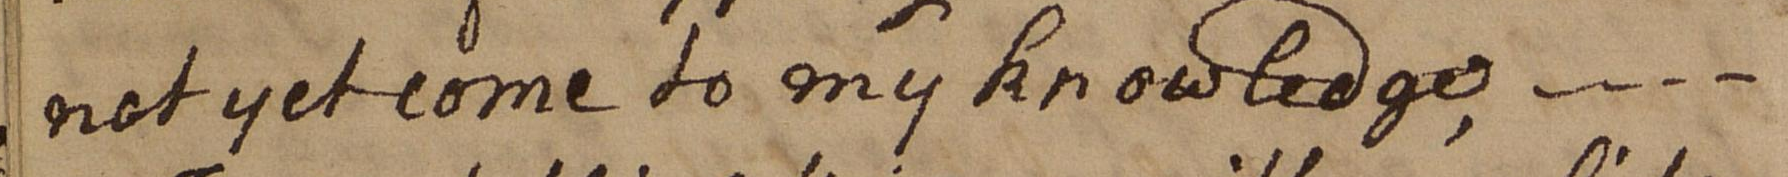not yet come to my knowledge,---
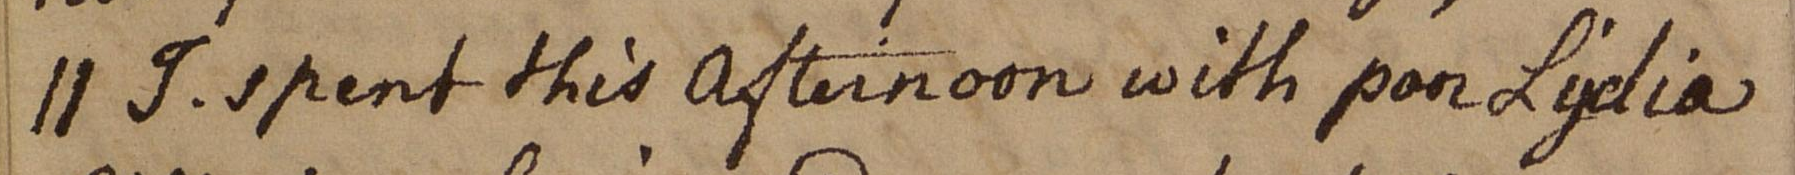11 I. spent this afternoon with poor Lydia
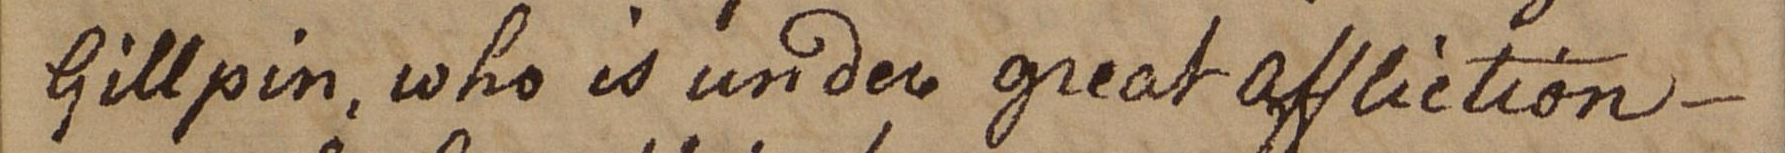Gillpin, who is under great affliction-
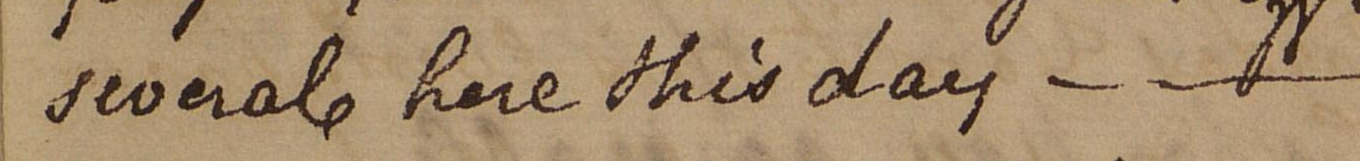several here this day--
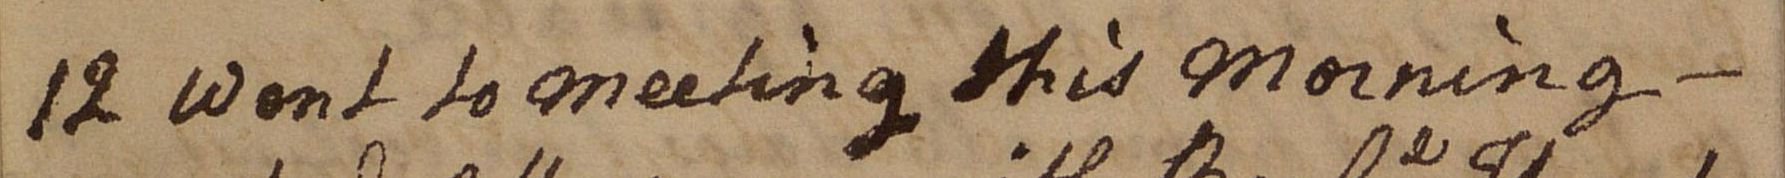12 went to meeting this morning-
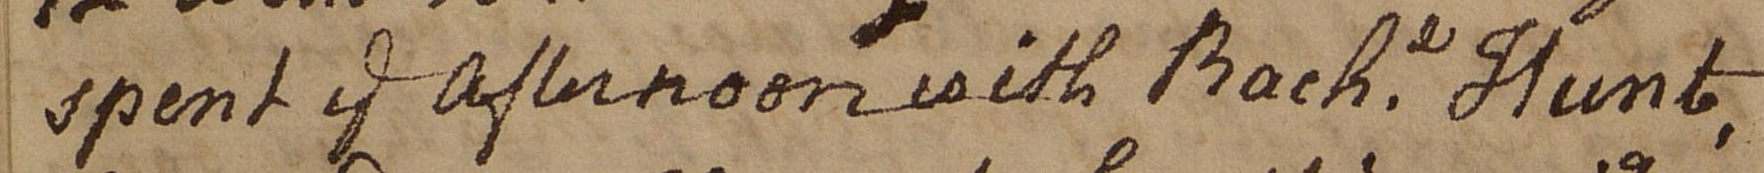spent y^e afternoon with Rach^l. Hunt
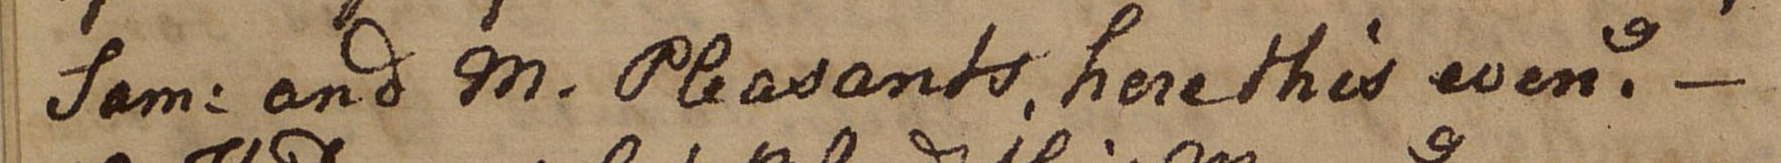Sam: and M. Pleasants, here this even^g.-
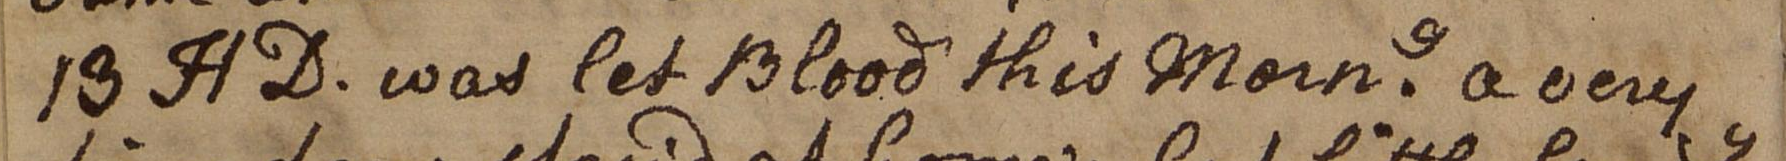13 H D. was let Blood this Morn^g. a very
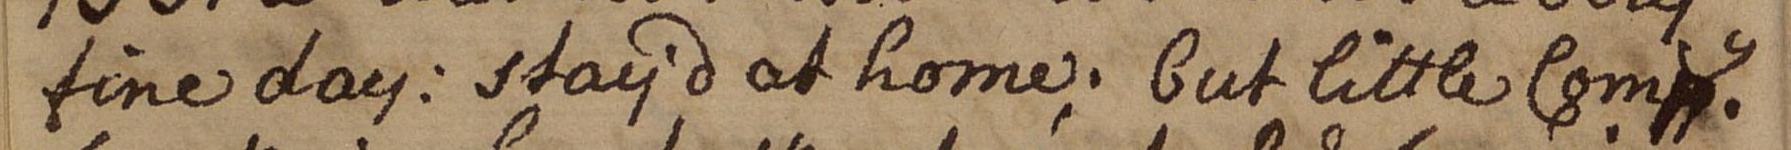fine day: stay'd at home; but little Comp^y.
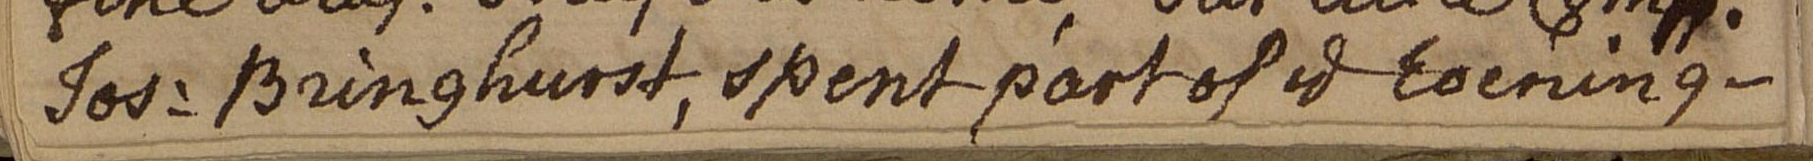Jos: Bringhurst, spent part of y^e Evening-
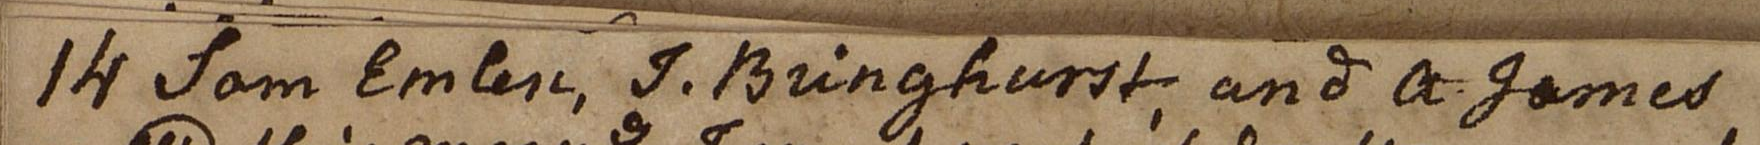14 Sam Emlen, J. Bringhurst and A James,
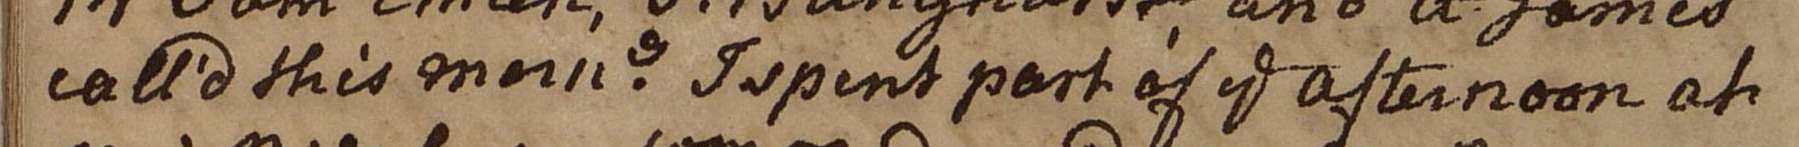call'd this morn^g. I spent part of y^e afternoon at
